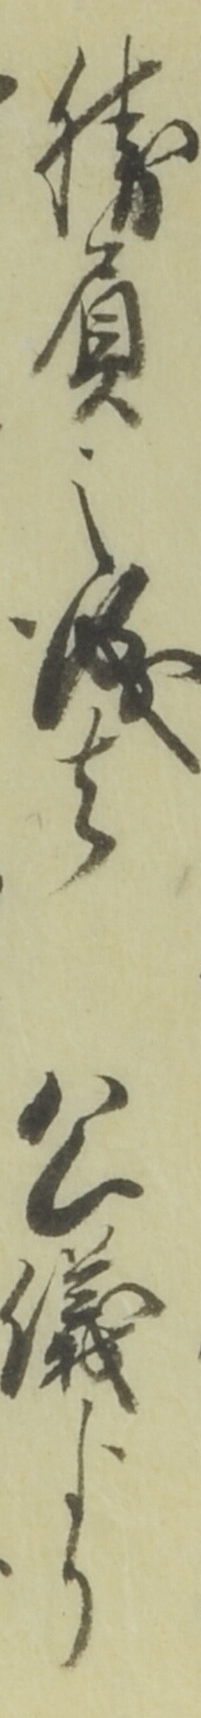勝負之儀は公儀より
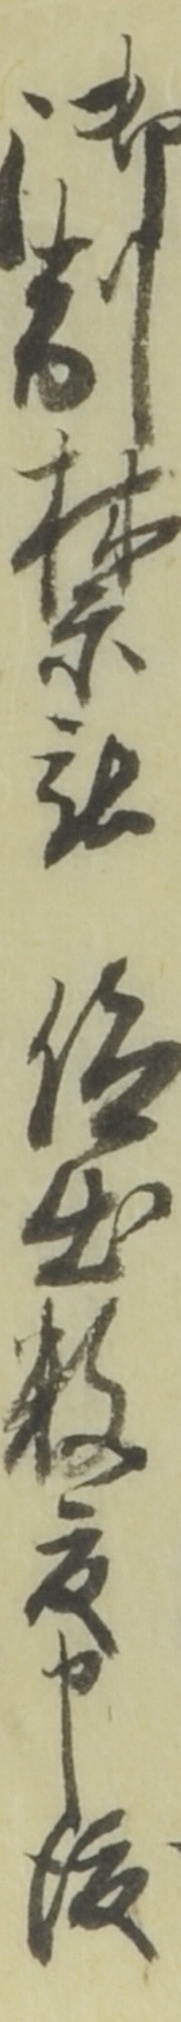御制禁被仰出数度申渡
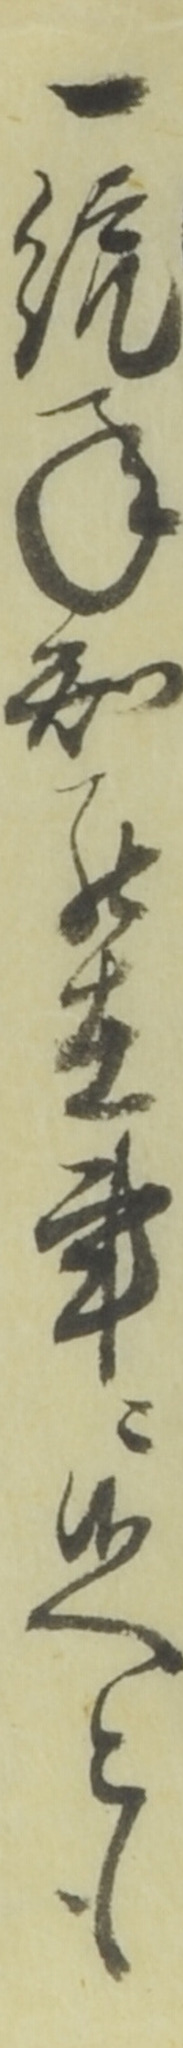一統承知罷在事ニ候へとも

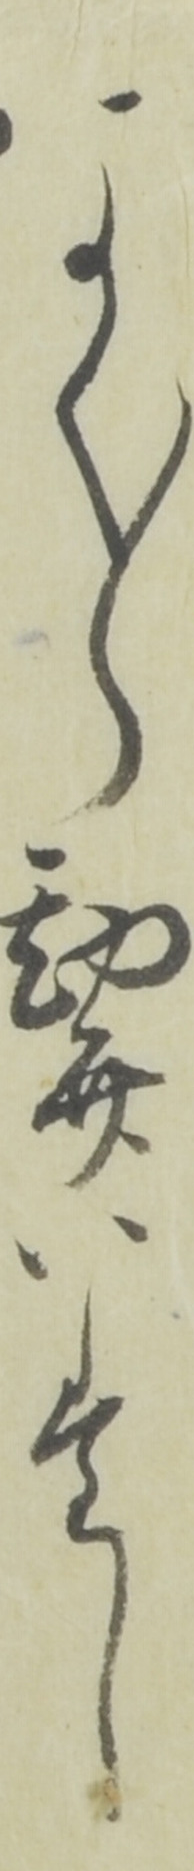よく〳〵勘弁いたし
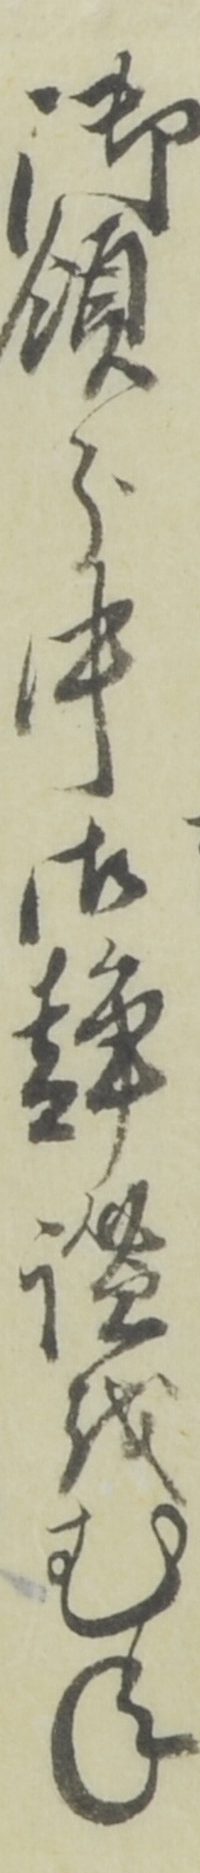御領分中御静謐をむね
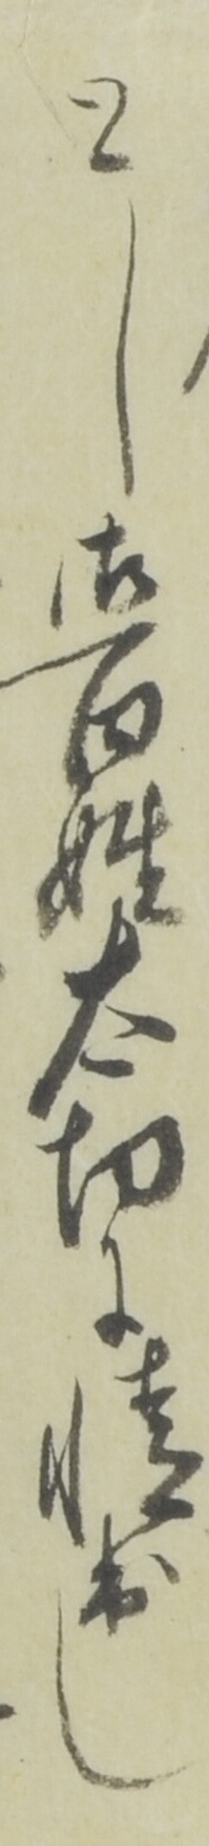とし御百姓太切に情出し
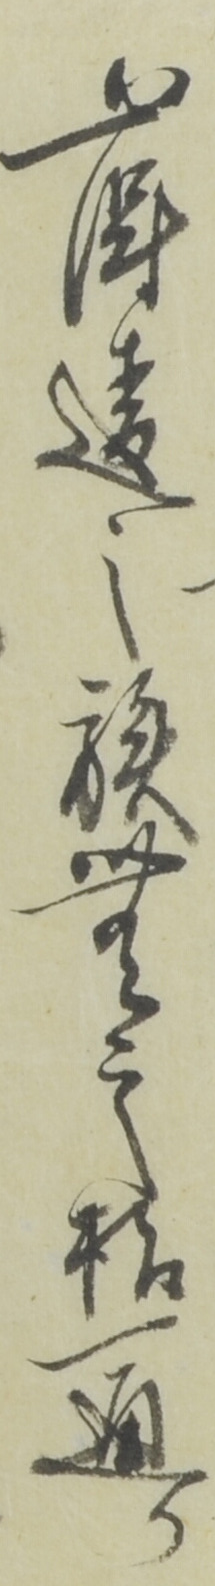心得違之族無之様一通り
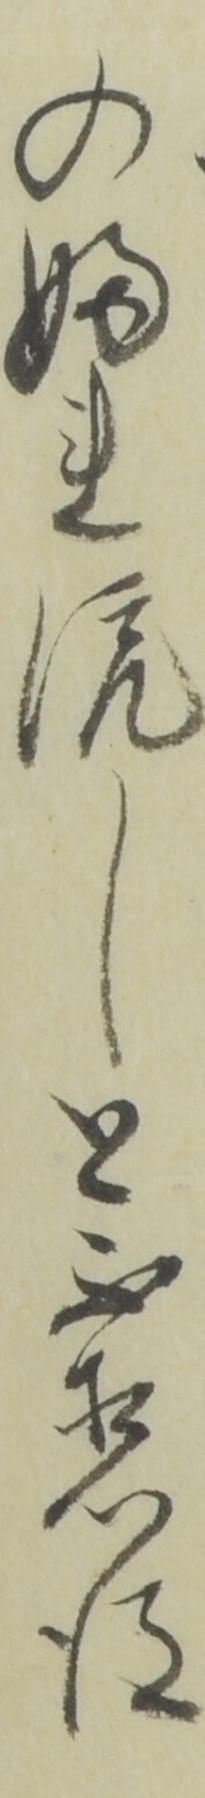のふれ流しと不相心得
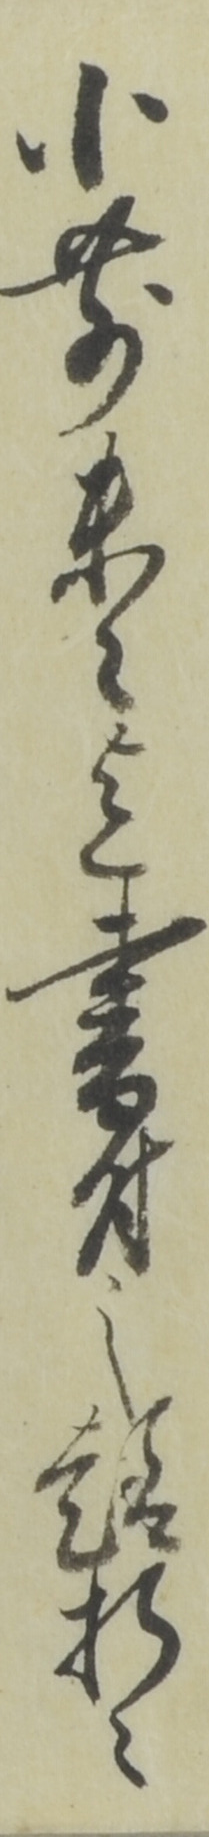小前末々迄書付之趣折々
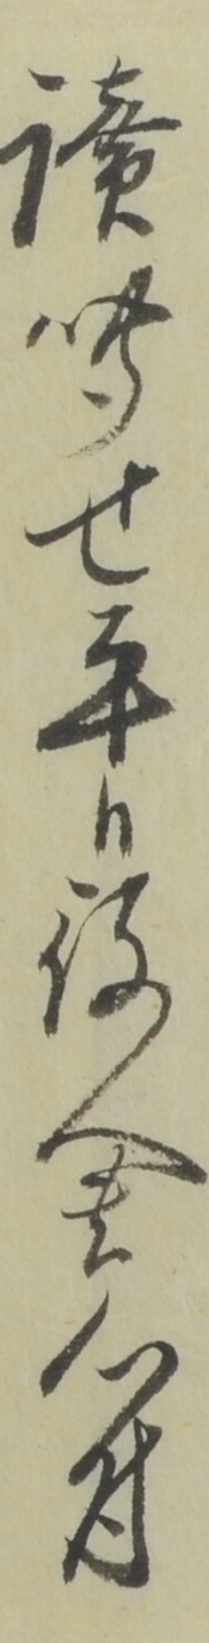読聞せ平日役人共心付
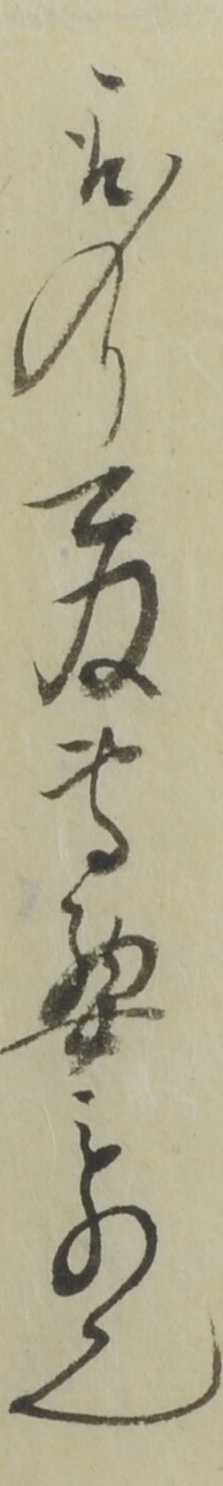取〆り可及専要もの也
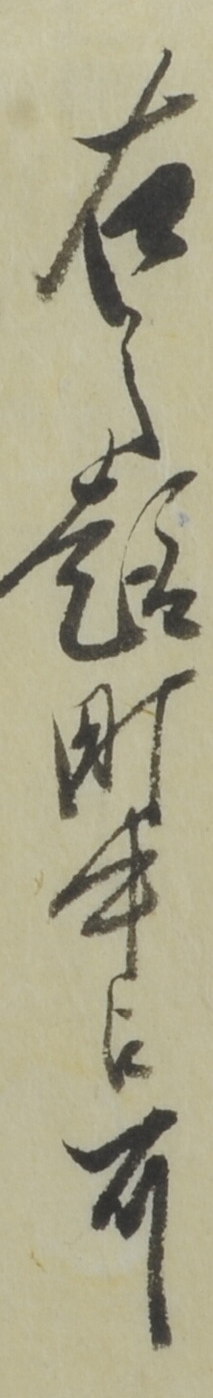右之趣町中江可
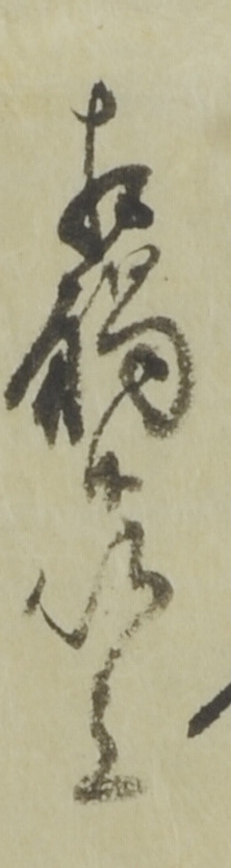相触候以上
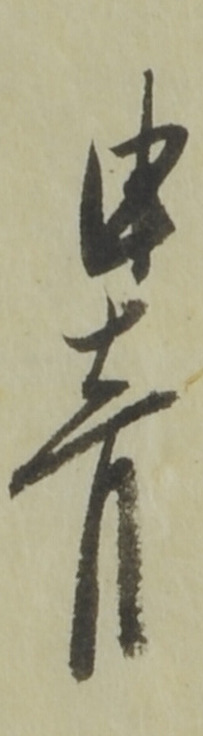申十二月
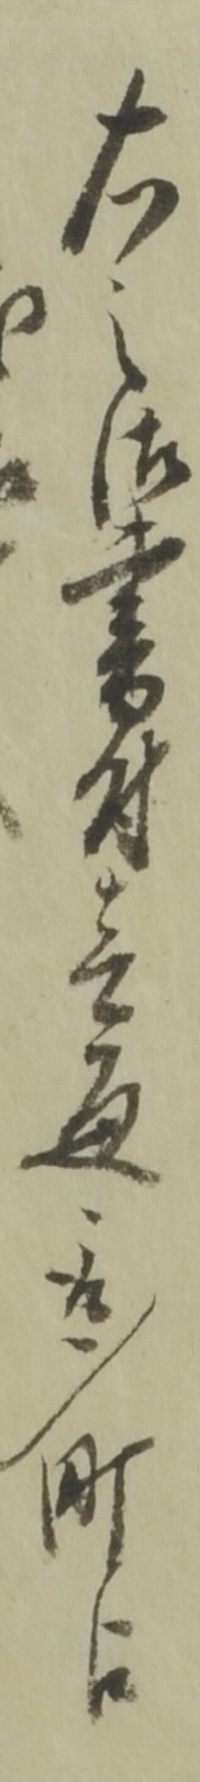右之御書付壱通取〆町江
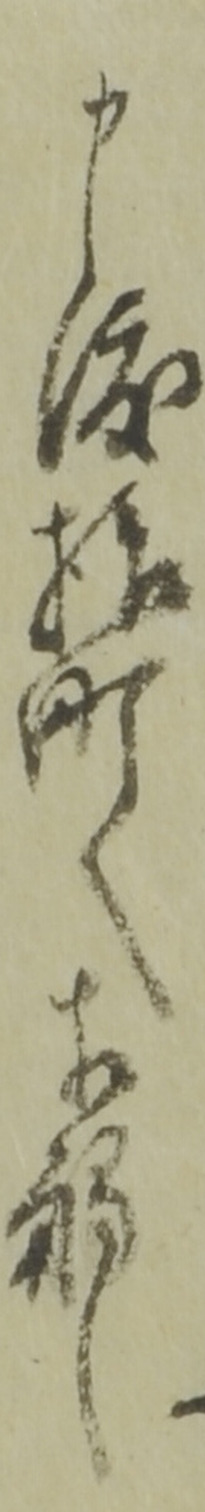申渡拾町へ相触候
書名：御触書御書附控
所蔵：伊那市立高遠町図書館・合同会社AMANE
